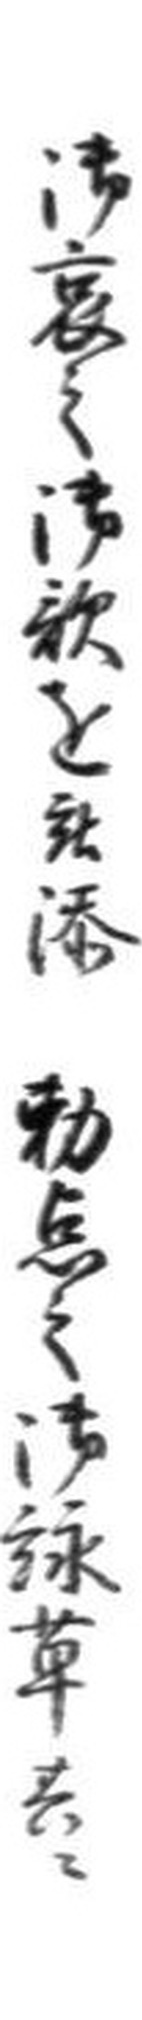御哀之御歌を被添勅点之御詠草共ニ
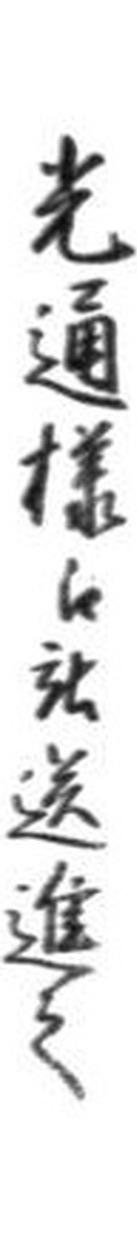光通様江被送進之
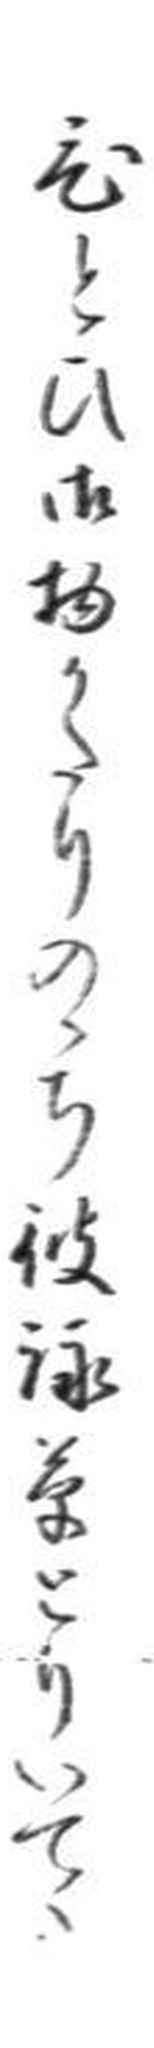ひとひ御物かたりのゝち彼詠草とりいてゝ
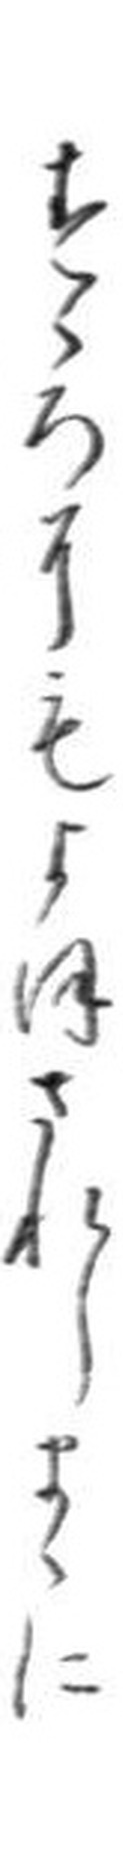すゝろにもよほされしまゝに
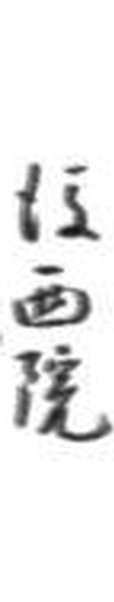後西院

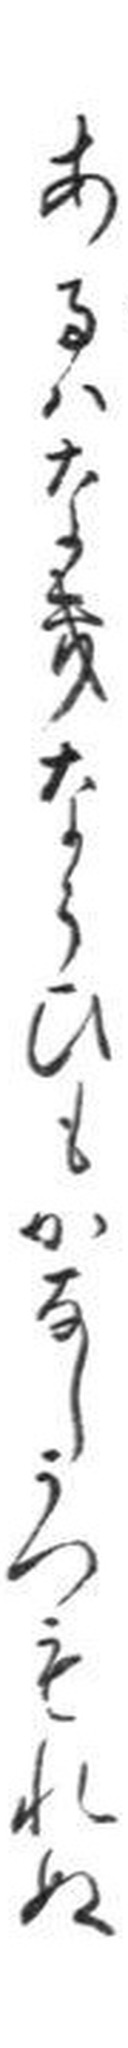あるはなきならひもかなしうつもれぬ
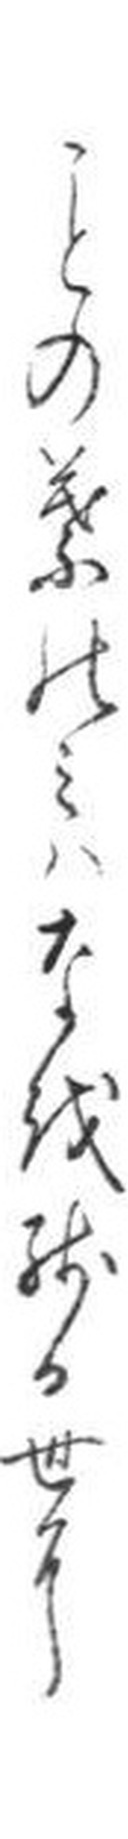ことの葉のみはなを残る世に
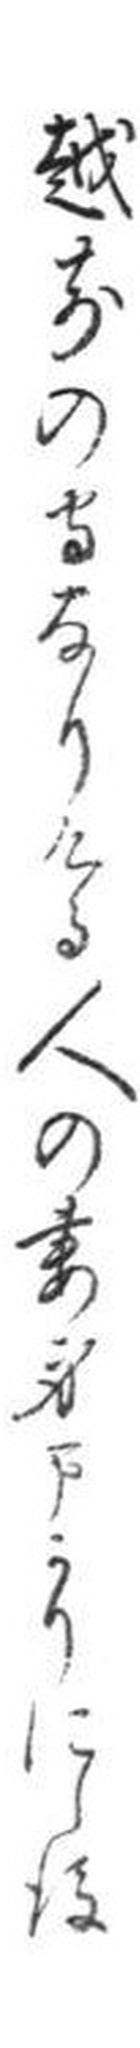越前の守なりける人の妻みまかりにし後
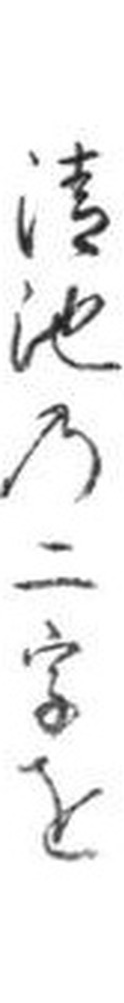清池の二字を
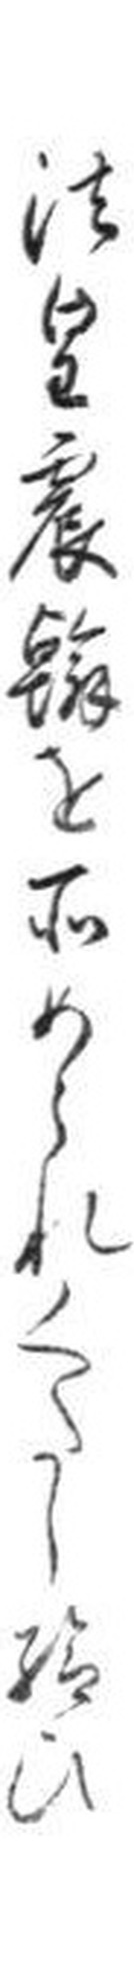法皇宸翰をそめられくたし給ひ
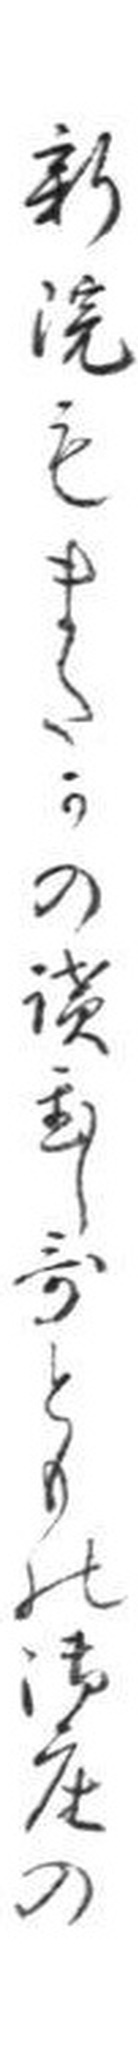新院もまたかの読置し哥ともの御座の
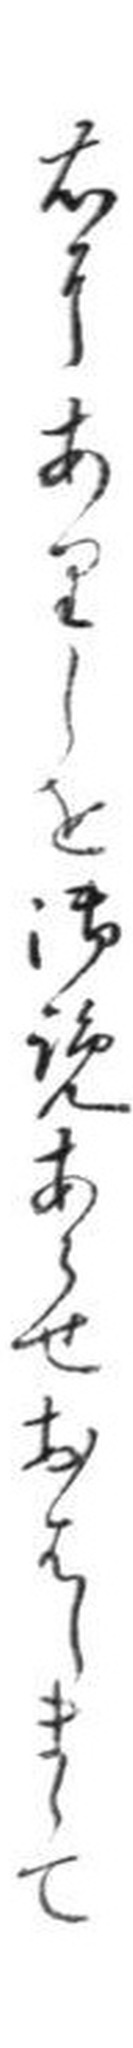右にありしを御覧あらせおはしまして
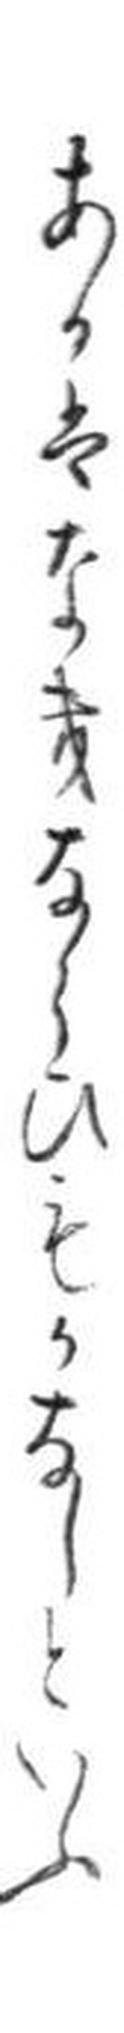あるはなきならひもかなしといふ
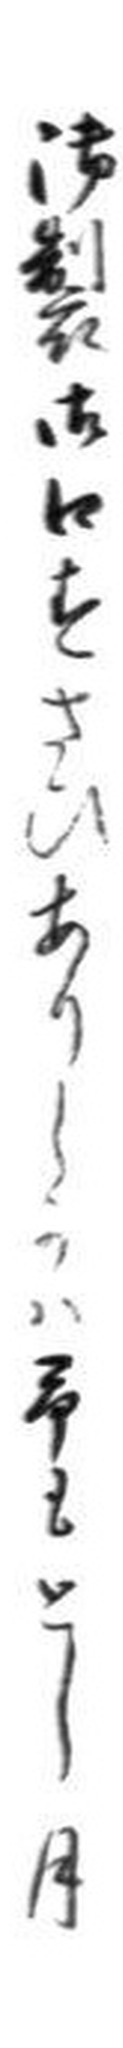御製御口すさひありしかは予もとし月
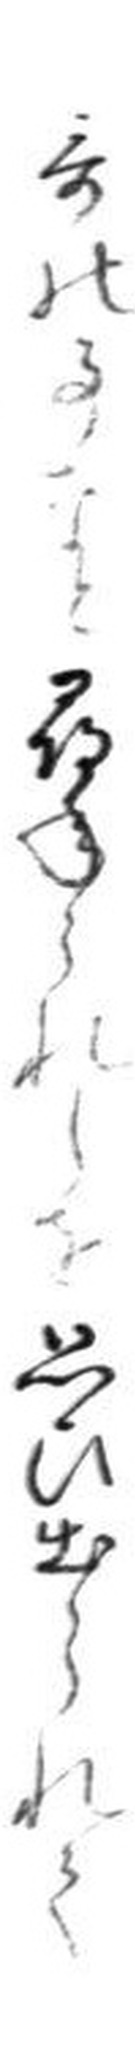哥の事なと尋ねられしを思ひ出られて
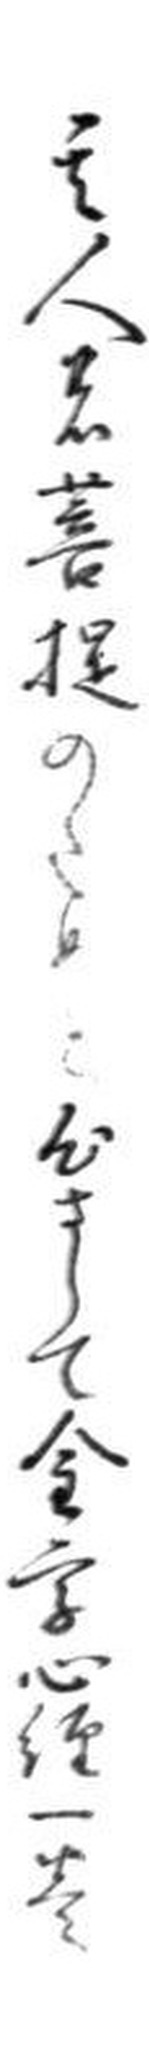其人は菩提のためと心さして金字心経一巻
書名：家譜 八 光通公 従寛文十年到同十二年
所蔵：福井県文書館 Fukui Prefectural Archives
